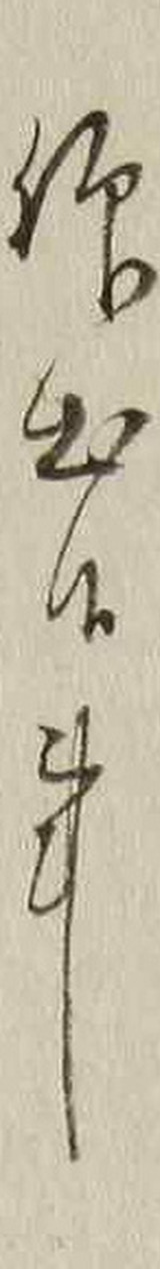仰出候事
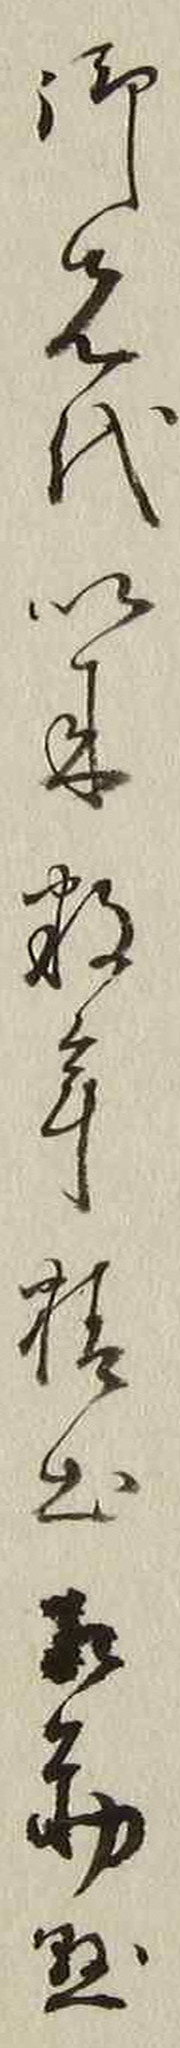御先代以来数年精出相勤懸
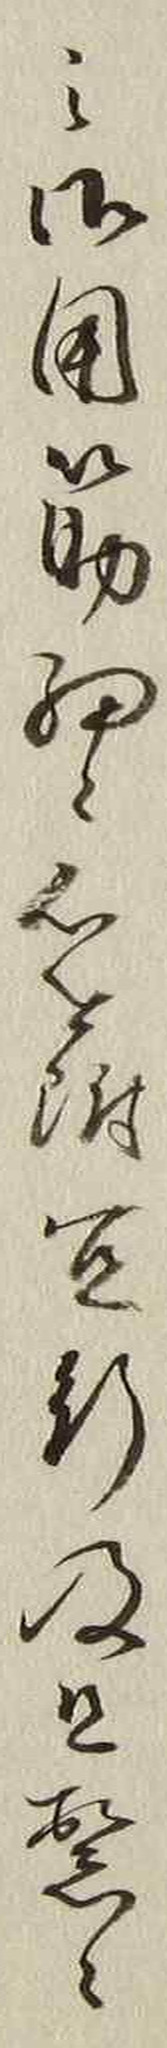之御用筋細々心を附宜行及旦繁々
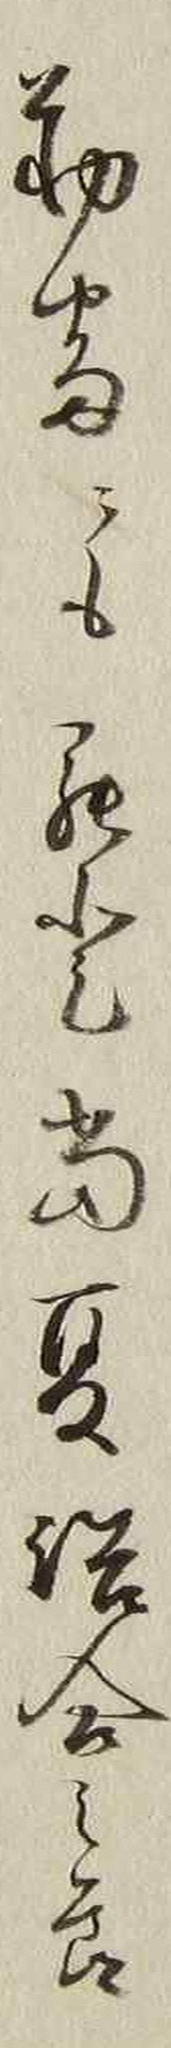勤番にも罷登当夏詰合之節
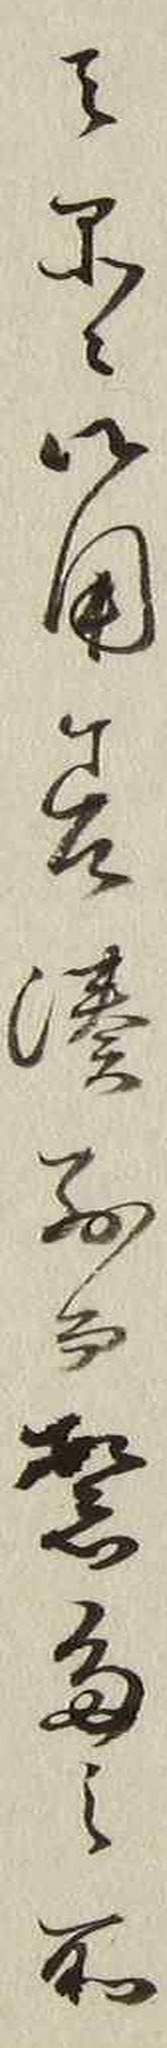は品々御用差湊別而繁多之所
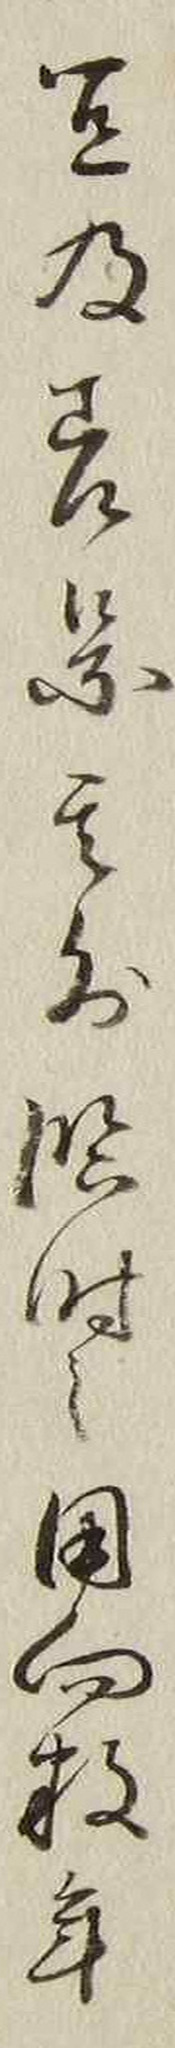宜及差図其外臨時之用向数年
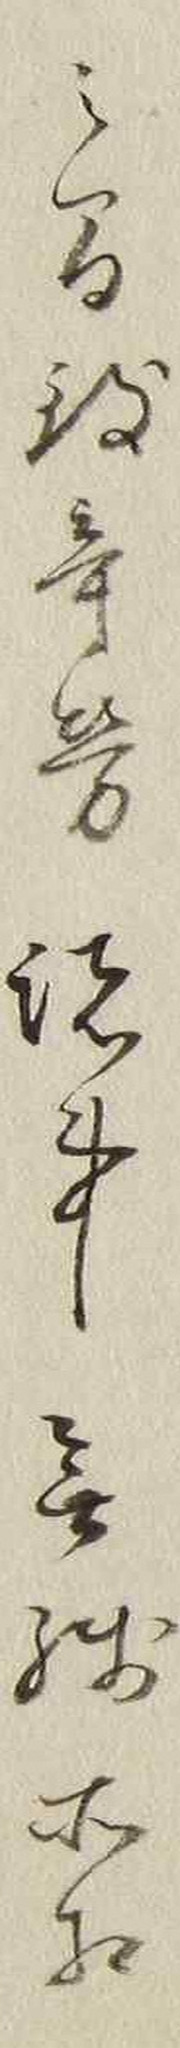之間致辛労諸事無残所相
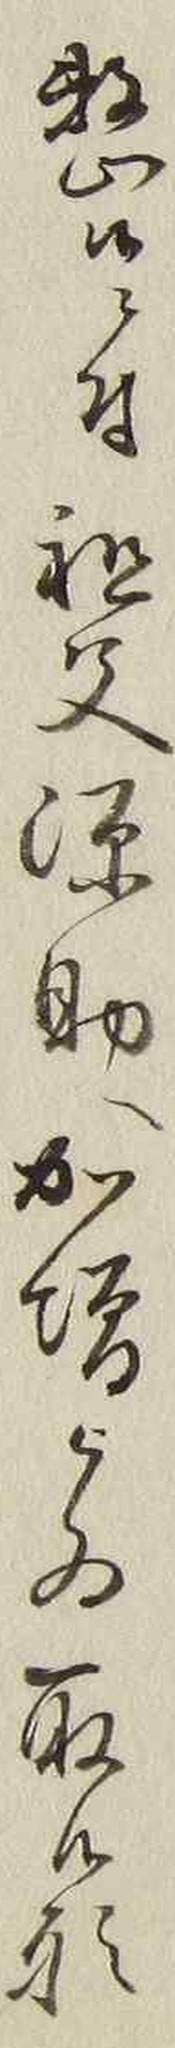整候に付祖父源助へ加増被為取候形
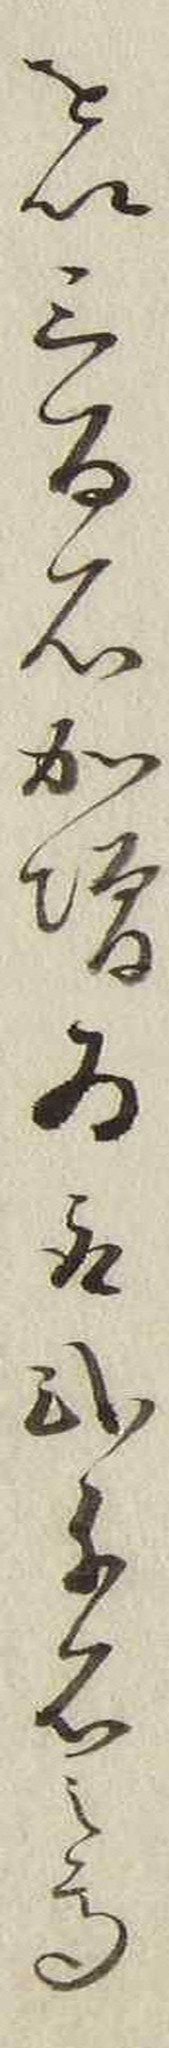を以三百石加増為取弐千石之高

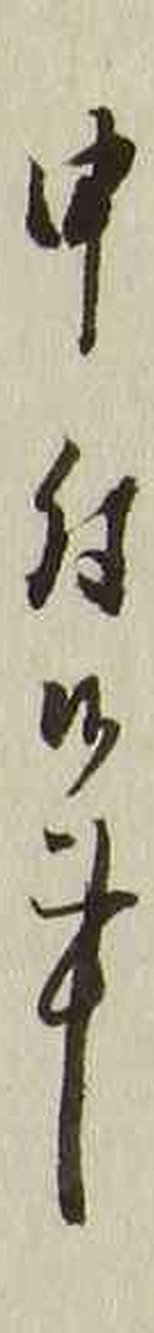申付候事
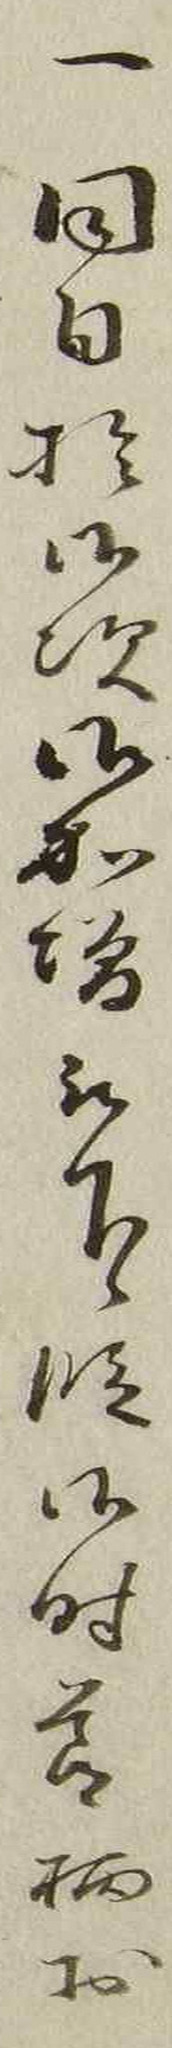一同日於御次御加増被下候段御時節柄於
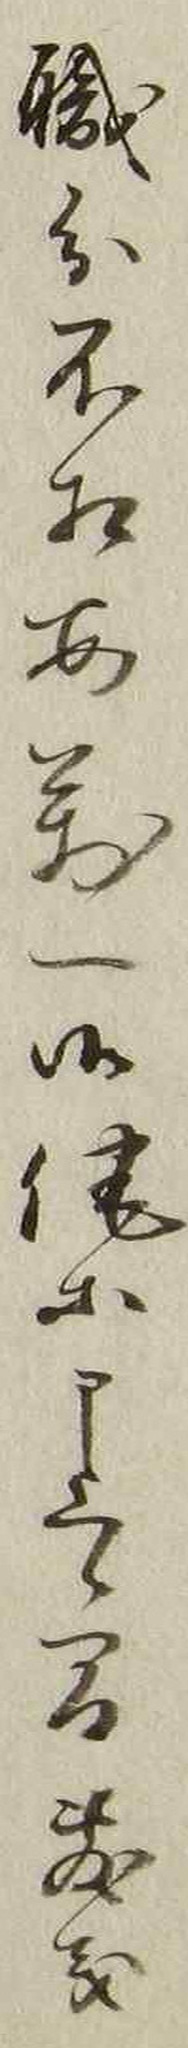職分不相安万一御詫等申上候間敷義
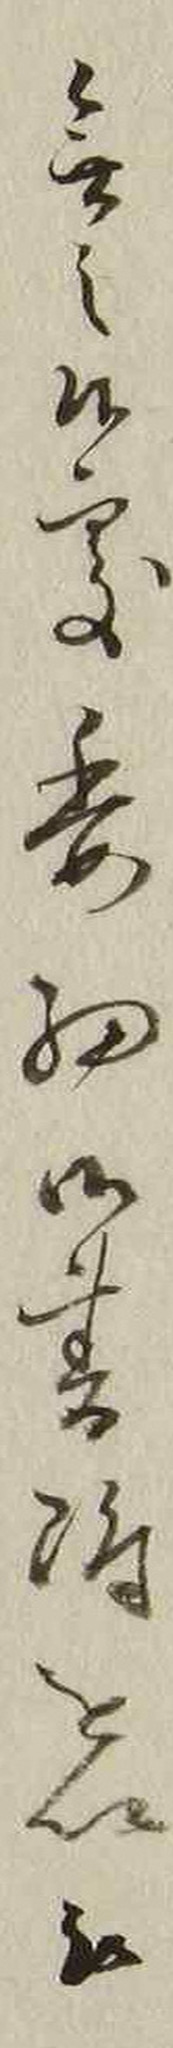無之候処委細御書附を以被
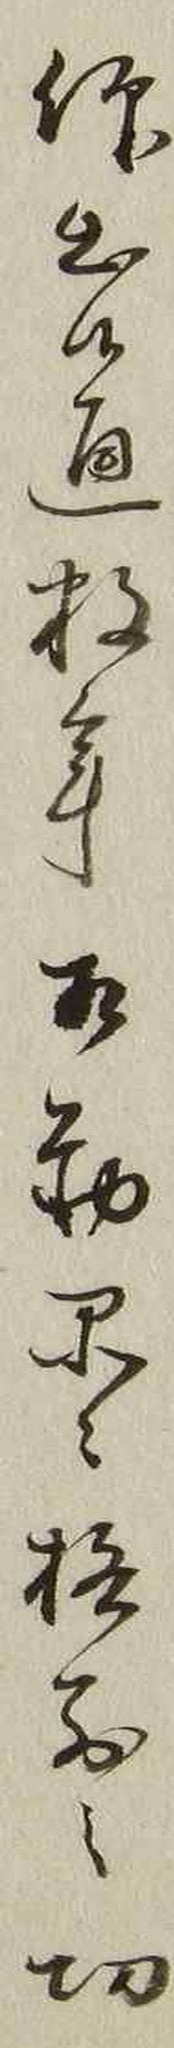仰出候通枚年相勤品々格別之切
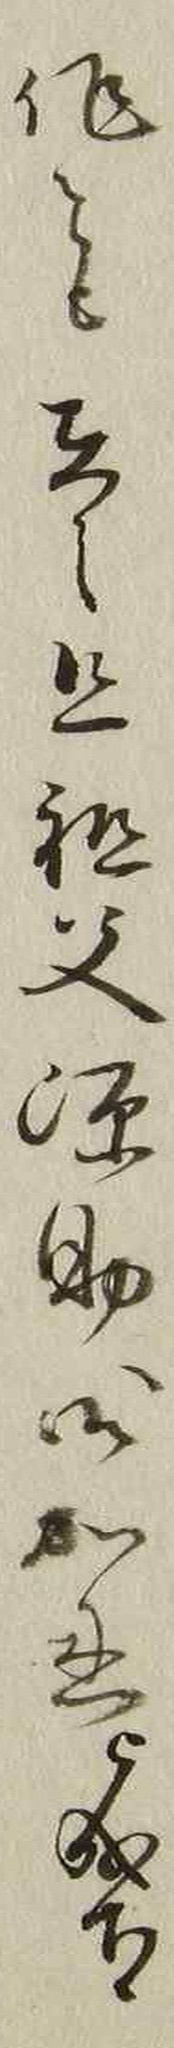作とも在之旦祖父源助へ御加置被成下候
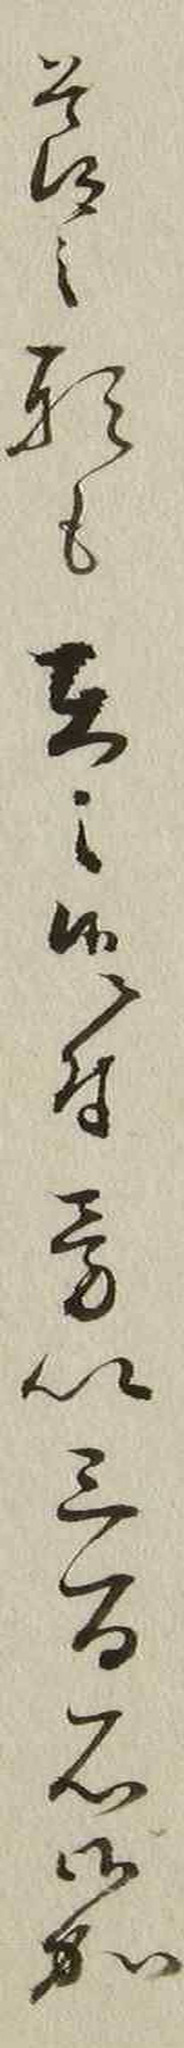節之形も在之候に付旁以三百石御加
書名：諸士系譜　巻之159　な之部1
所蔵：会津若松市立会津図書館
